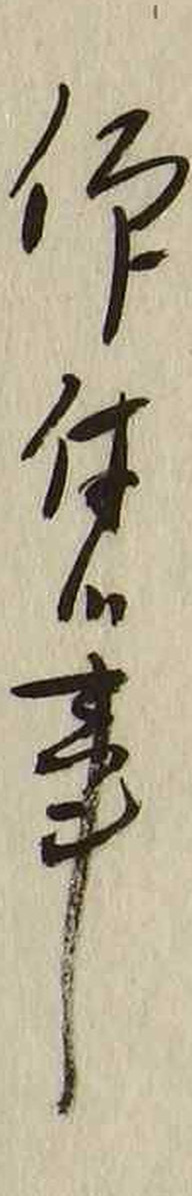仰付候事
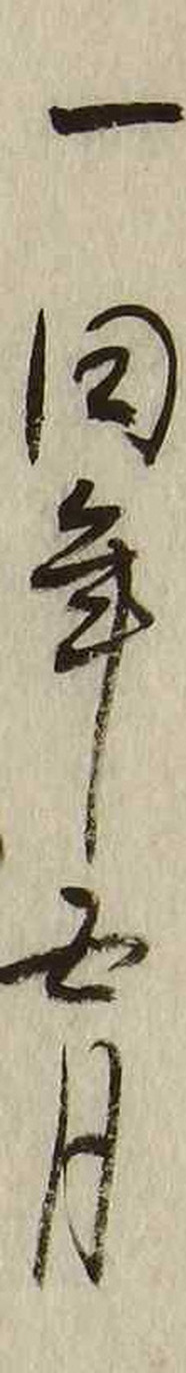一同年五月
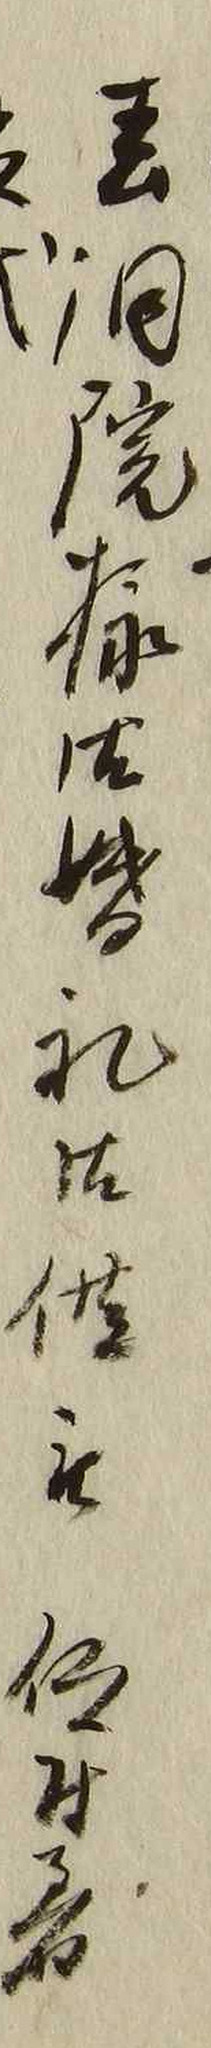春洞院様御婚礼御供被仰付着
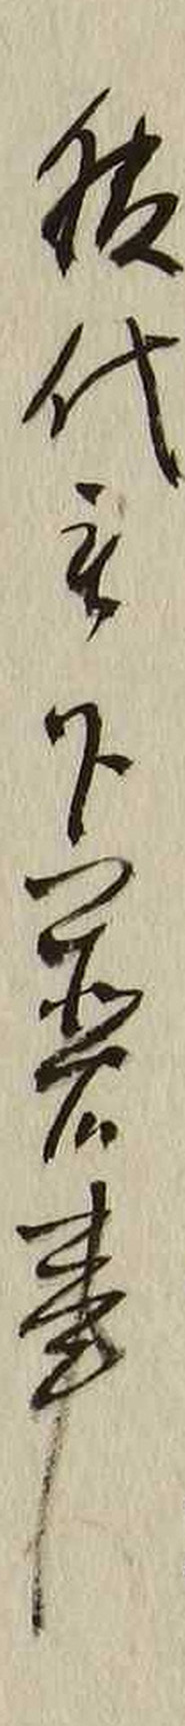服代被下置候事
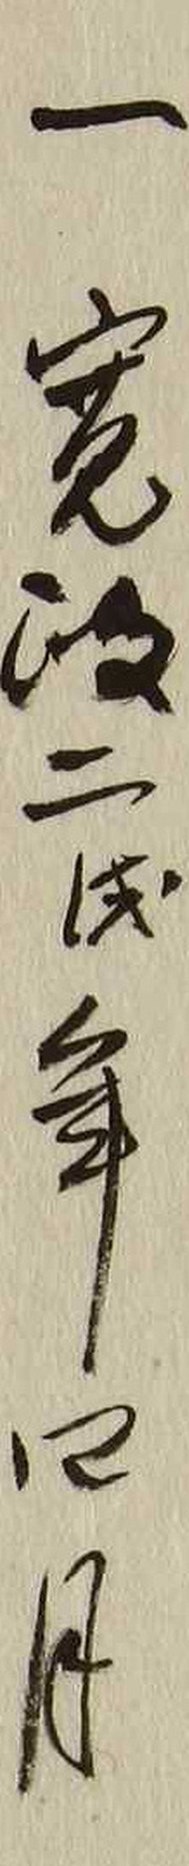一寛政二戌年四月
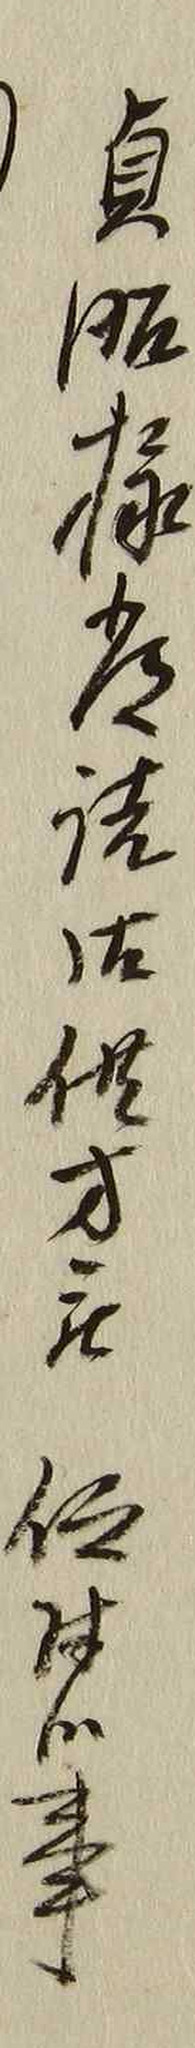貞昭様常詰御供方被仰付候事
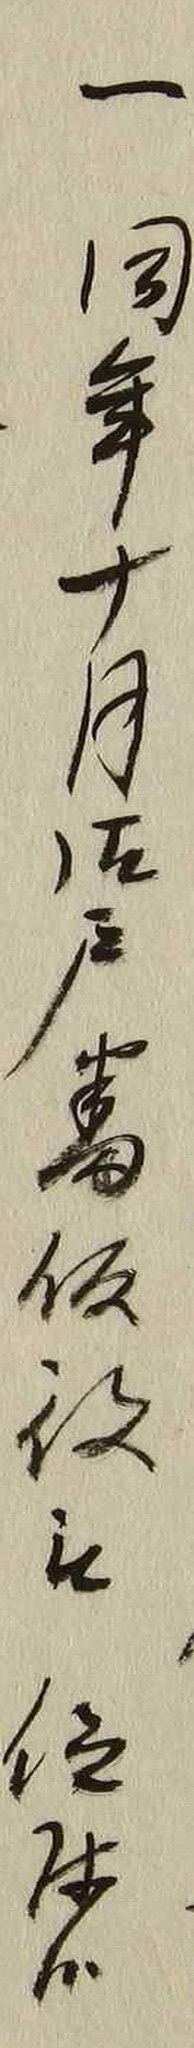一同年十月御戸番仮役被仰付候
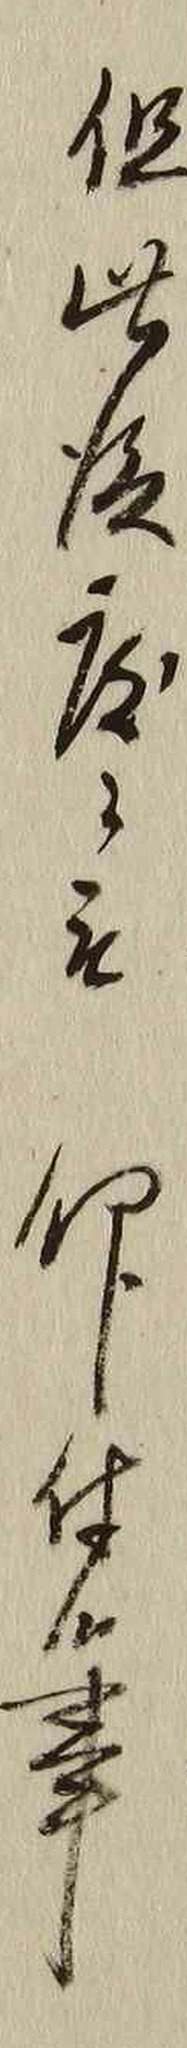但此後度々被仰付候事
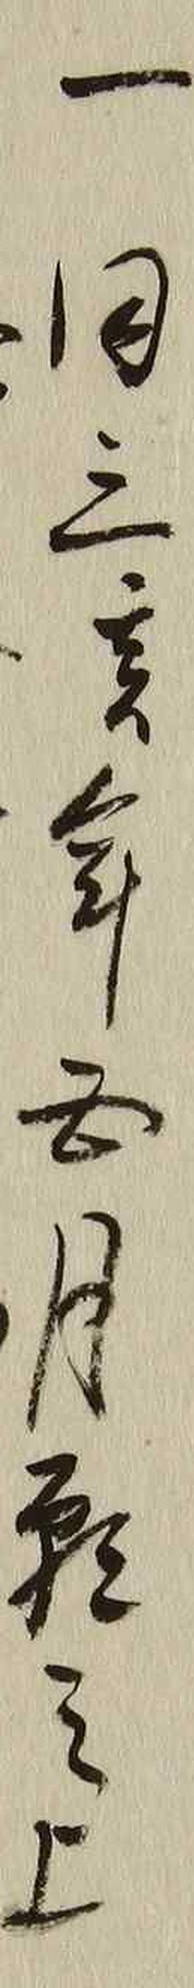一同三亥年五月願之上
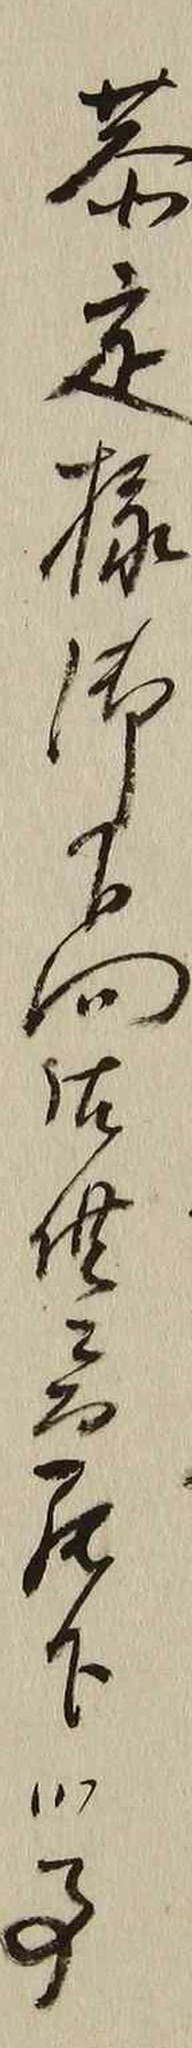恭定様御下向御供ニ而罷下候事
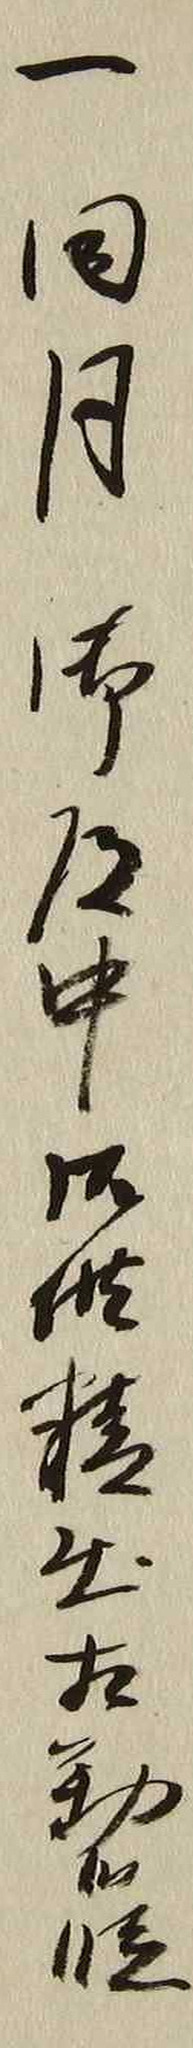一同月御道中御供精出相勤候段
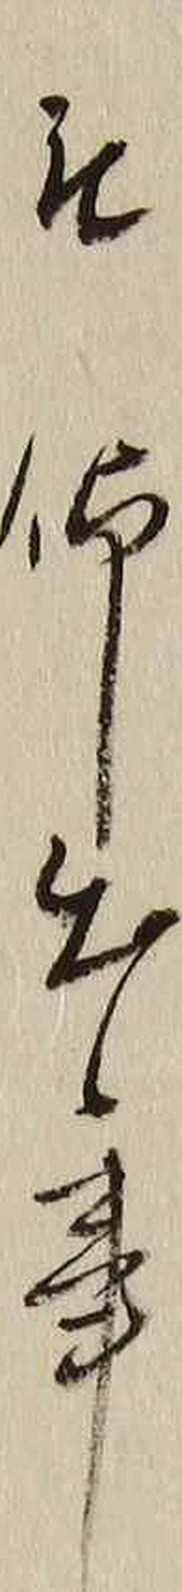被仰出候事
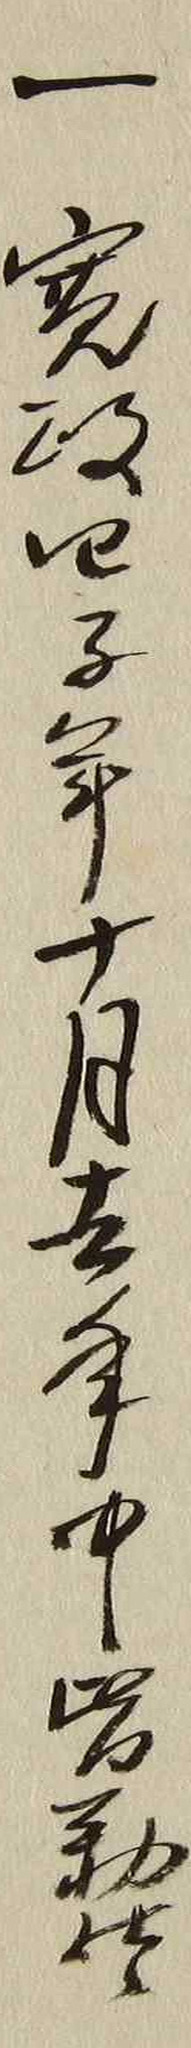一寛政四子年十月去年中皆勤仕候
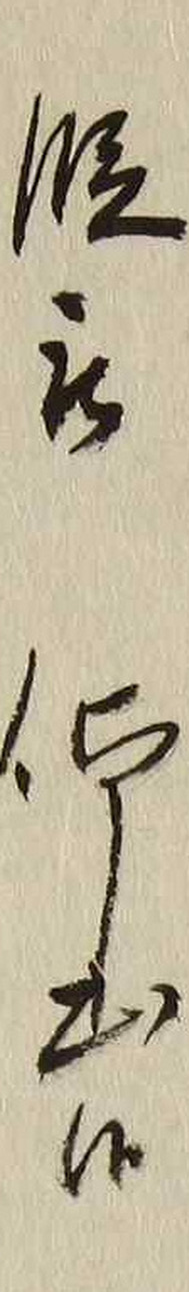段被仰出候
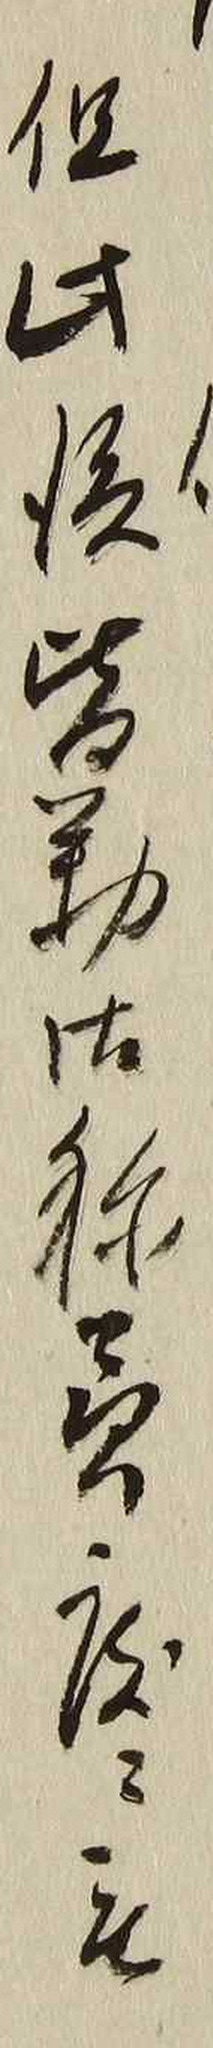但此後皆勤御称美度々被
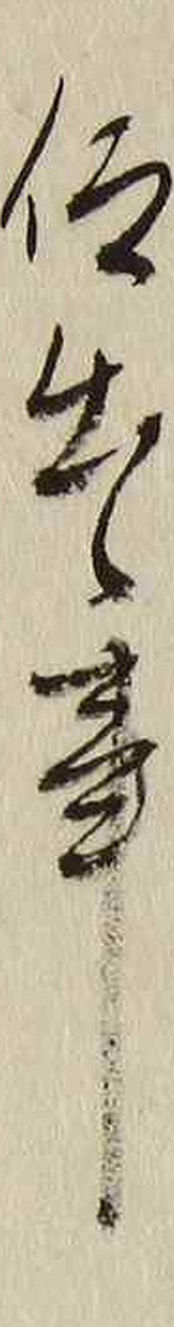仰出候事
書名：諸士系譜　巻之349　も之部5
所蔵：会津若松市立会津図書館
